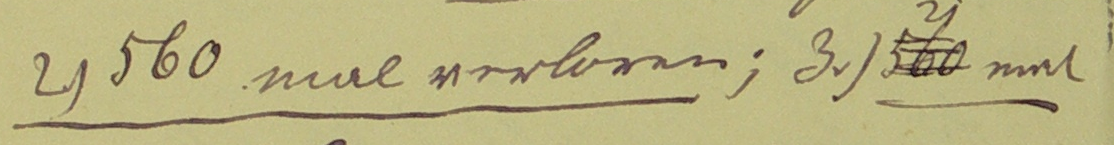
2) 560 mal verloren; 3) 21 mal
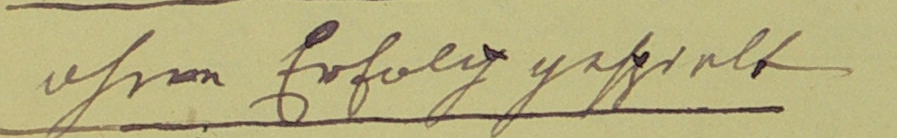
ohne Erfolg gespielt.
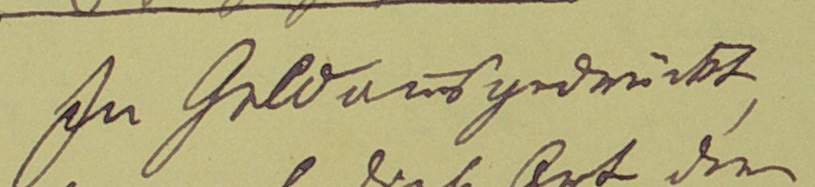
In Geld ausgedrückt
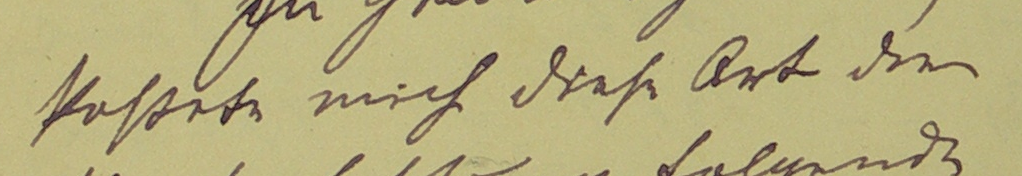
kostete mich diese Art der
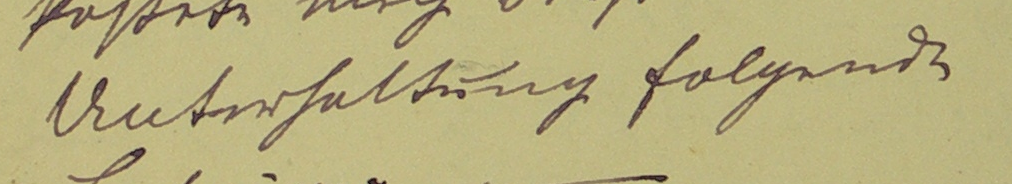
Unterhaltung folgende
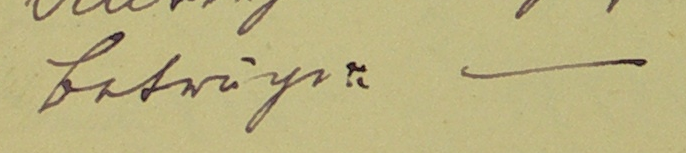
Beträge:----
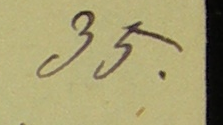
35
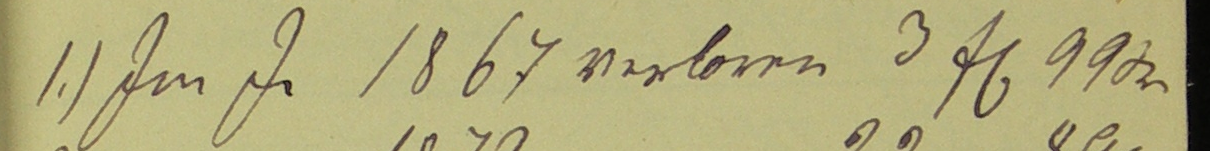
1.) Im Jahre 1867 verloren = 3 fl 99 Tr
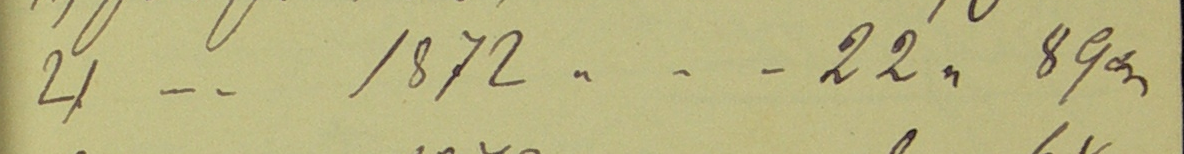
2.) * 1872 * = 22 * 89 *
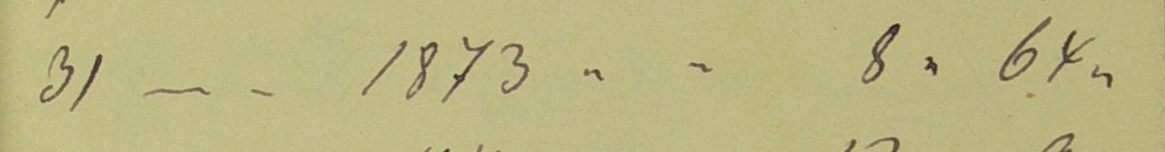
3) * 1873 * = 8 * 64 *
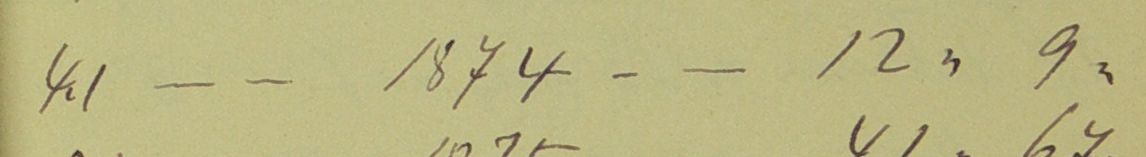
4.) * 1874 * = 12 * 9 *
